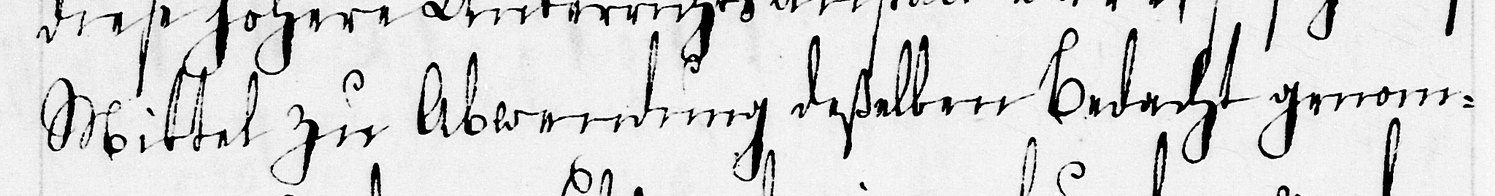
Mittel zu Abwendung deßelben Bedacht genom¬
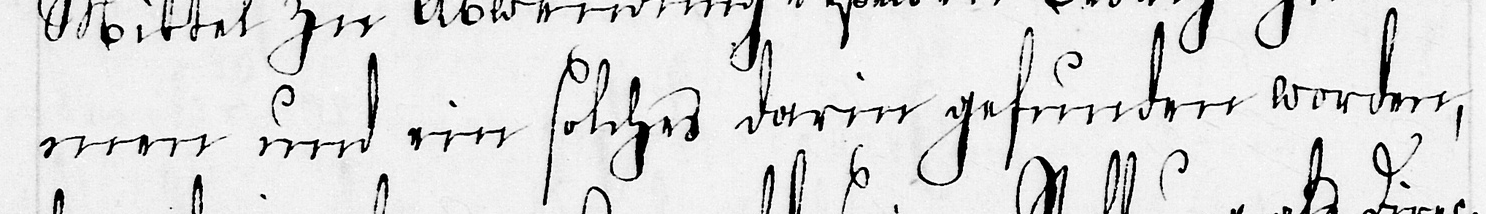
men und ein solches darin gefunden worden,
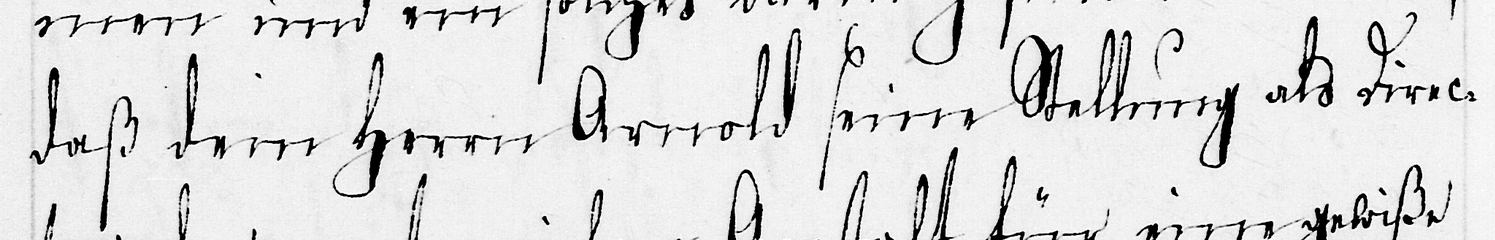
daß dem Herrn Arnold seine Stellung als Dire¬
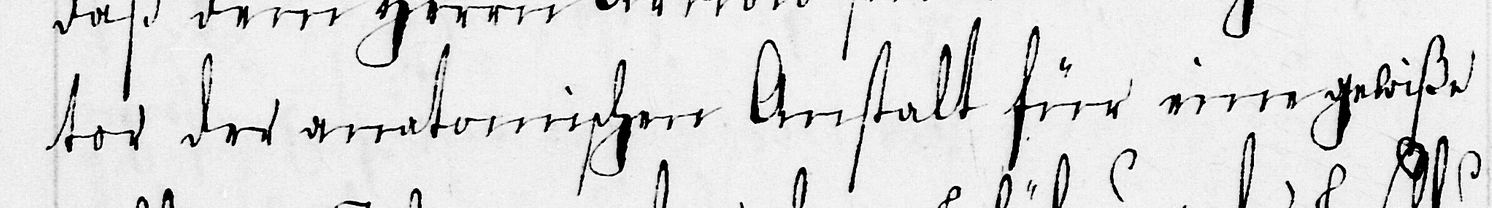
ctor der anatomischen Anstalt für eine gewiße
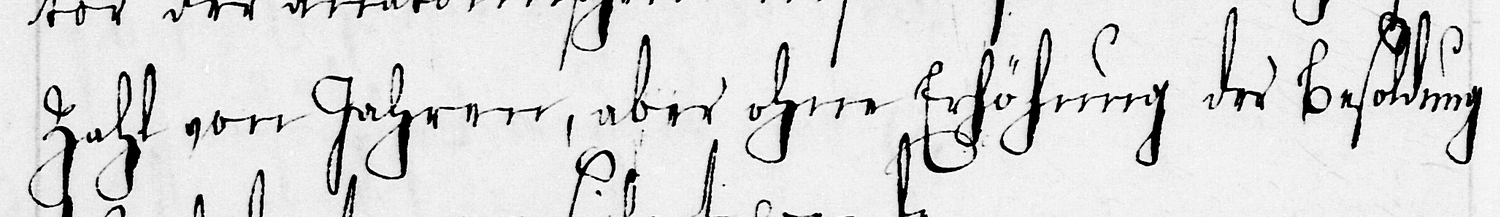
Zahl von Jahren, aber ohne Erhöhung der Besoldung
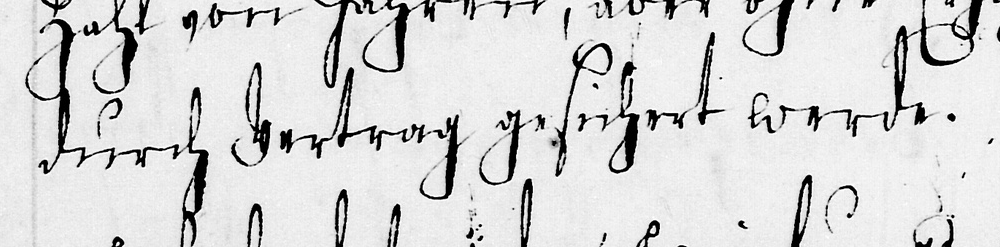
durch Vertrag gesichert werde.
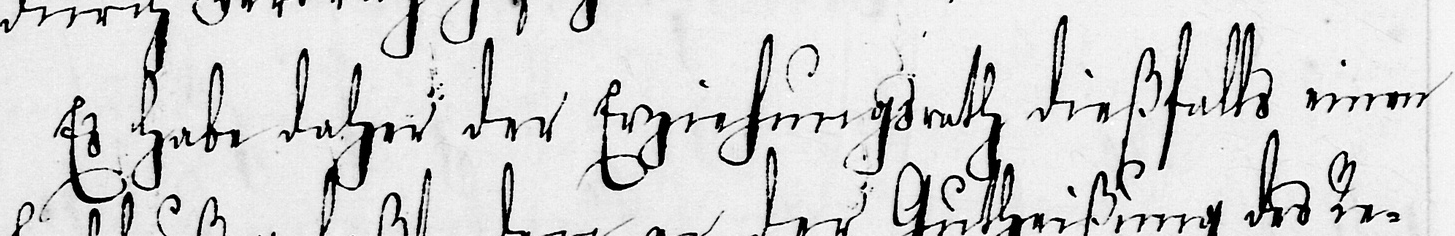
Es habe daher der Erziehungsrath dießfalls einen
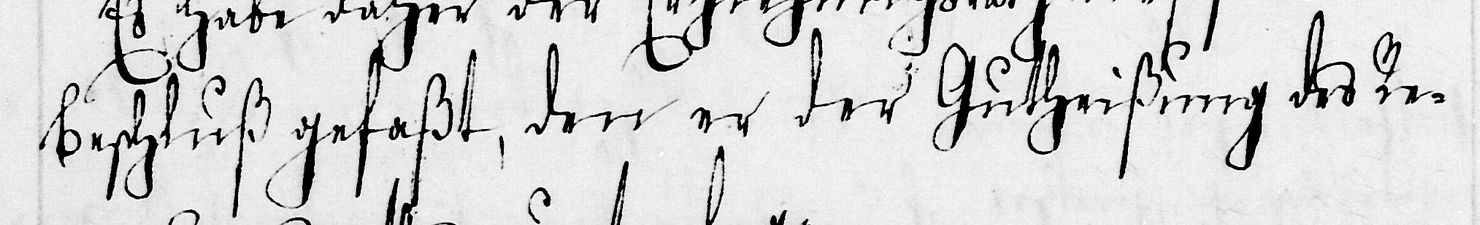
Beschluß gefaßt, den er der Gutheißung des Re¬
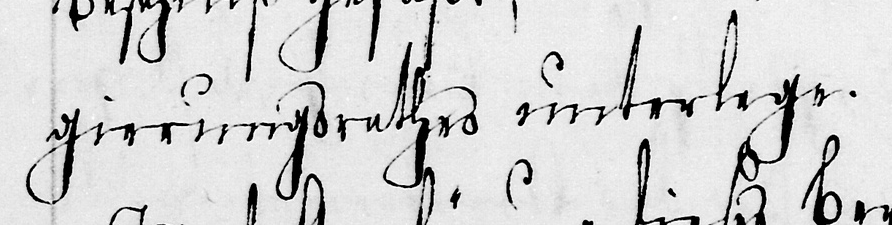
gierungsrathes unterlege.
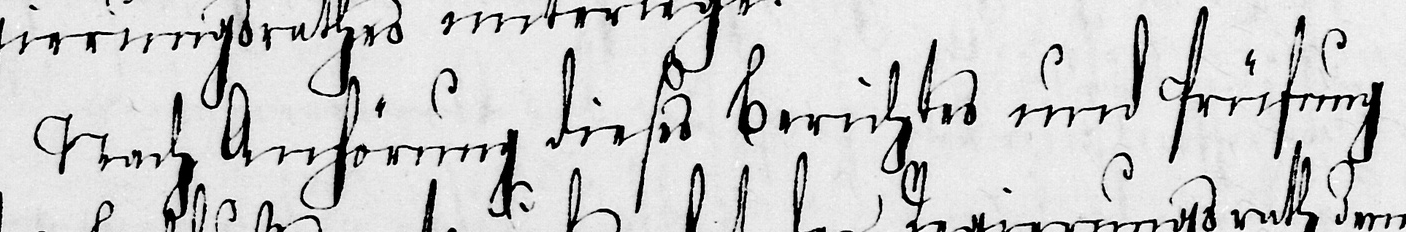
Nach Anhörung dieses Berichtes und Prüfung
